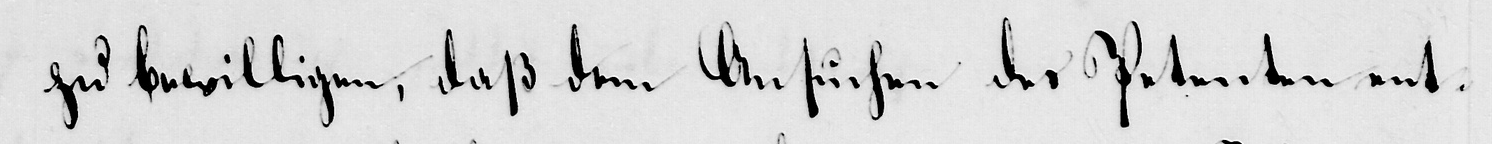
zu bewilligen, daß dem Ansuchen des Petenten ent¬
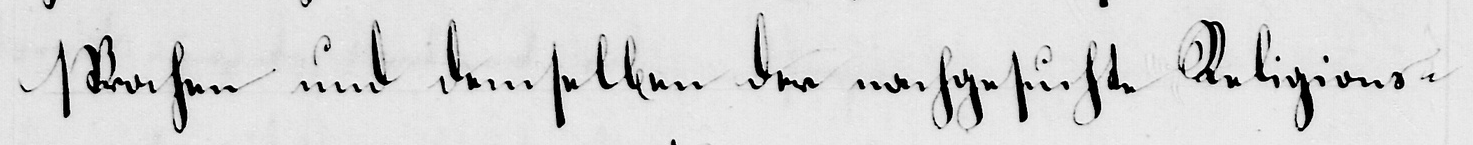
sprochen und demselben der nachgesuchte Religions¬
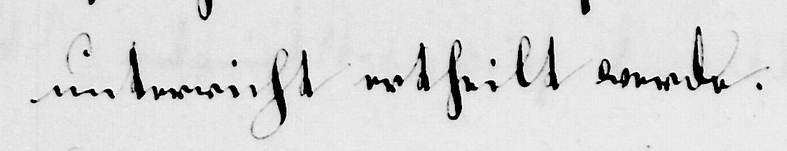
unterricht ertheilt werde.
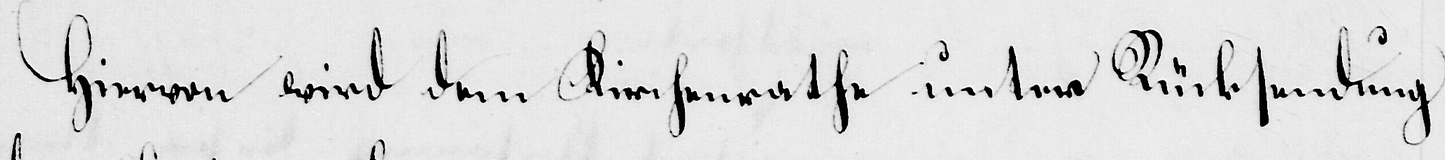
Hiervon wird dem Kirchenrathe unter Rücksendung
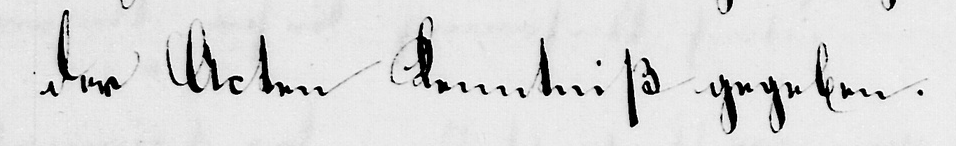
der Acten Kenntniß gegeben.
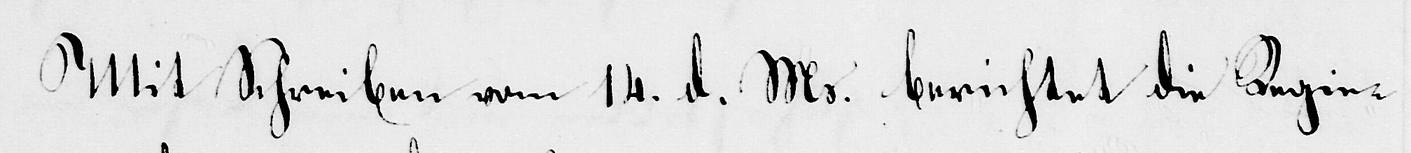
Mit Schreiben vom 14. d. Ms. berichtet die Regie¬
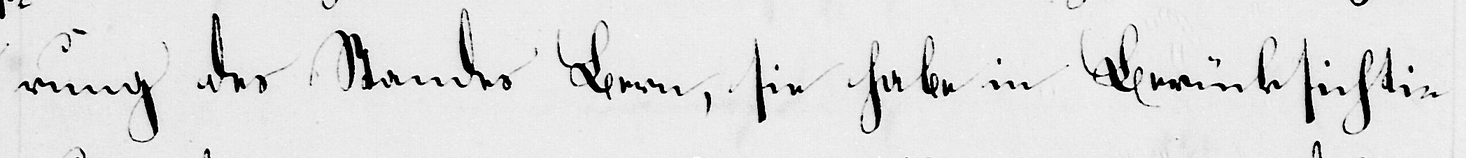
rung des Standes Bern, sie habe in Berücksichti¬
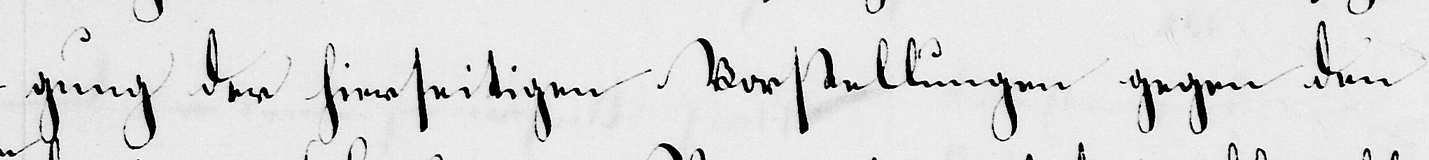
gung der hierseitigen Vorstellungen gegen den
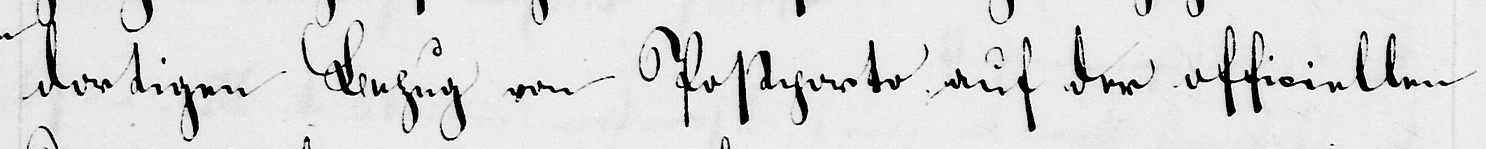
dortigen Bezug von Postporto auf der officiellen
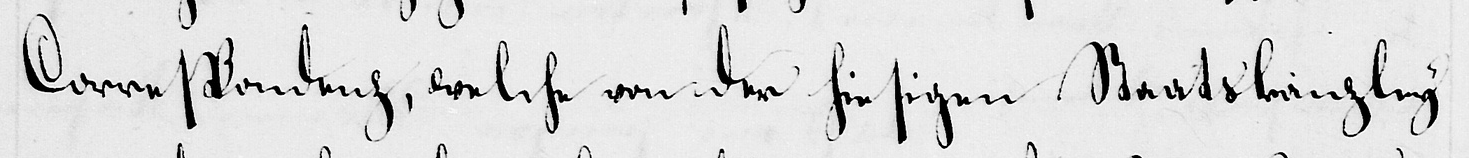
Correspondenz, welche von der hiesigen Staatskanzley
